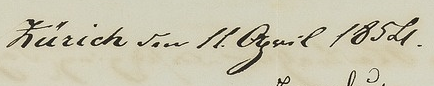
Zürich den 11. April 1854.
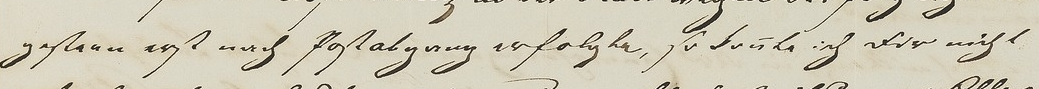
gestern erst nach Postabgang erfolgte, so konnte ich Dir nicht
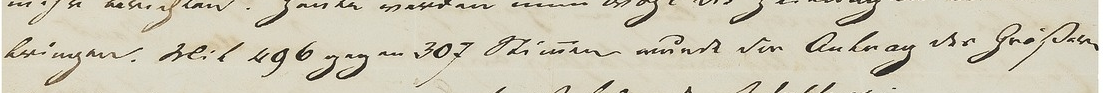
bringen. Mit 496 gegen 307 Stimmen wurde der Antrag des Größern
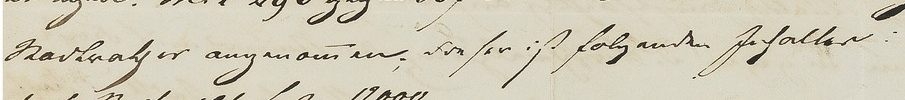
Stadtrathes angenommen; dieser ist folgenden Inhaltes:
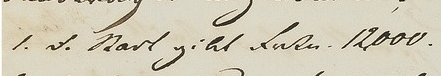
1. D. Stadt gibt Frkn. 12,000.
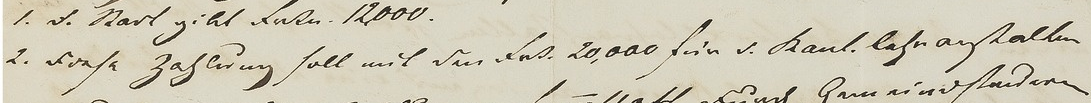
2. Diese Zahlung soll mit den Frk. 20,000 für d. Kant.lehranstalten
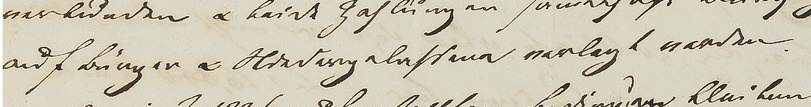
auf Bürger & Niedergelassene verlegt werden.
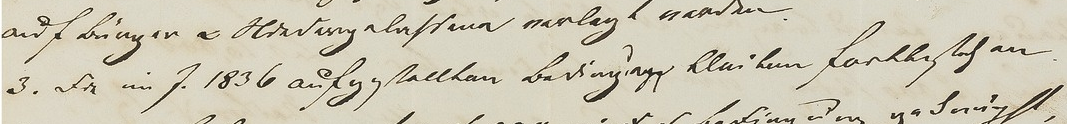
3. Die im J. 1836 aufgestellten Bedingungen bleiben fortbestehen.
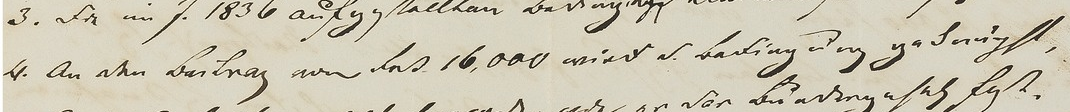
4. An den Beitrag von Frk. 16,000 wird d. Bedingung geknüpft,
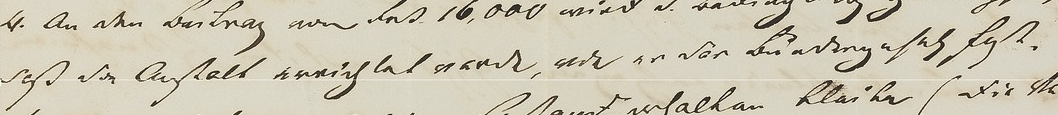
daß die Anstalt errichtet werde, wie es das Bundesgesetz fest-
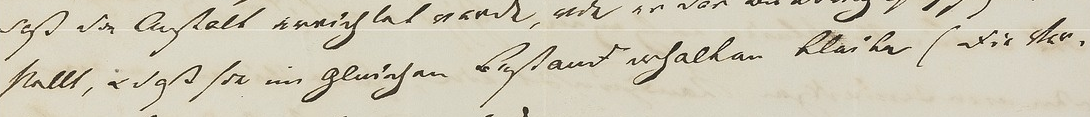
stellt, & daß sie im gleichen Bestand erhalten bleibe (Die Ver-
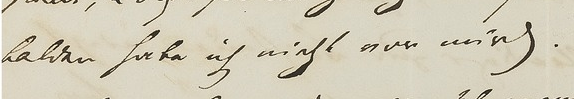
balien habe ich nicht vor mir).
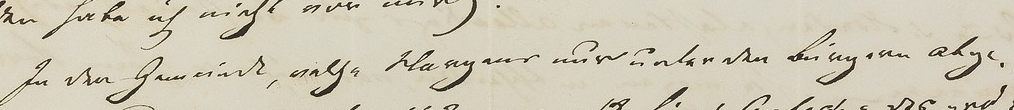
In der Gemeinde, welche Morgens nur unter den Bürgern abge-
